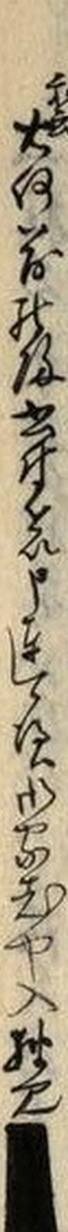私云右何茂罷帰書付を以申達候得ハ御家老中披見
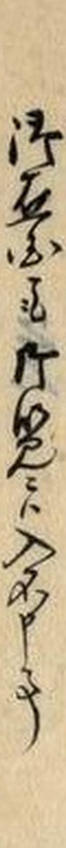御在国二も御覧ニハ入不申事

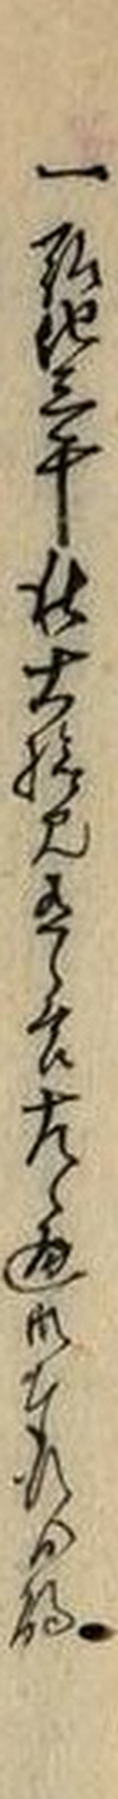一弘化三午秋大検見有之節左之通御奉行ゟ触
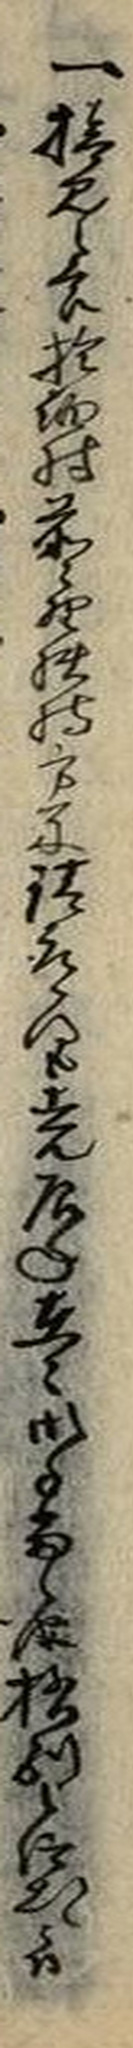一検見之節於泊村前々野扶持方米請取候得共去ル辰年在々御手当之儀格別之仰出候ニ付
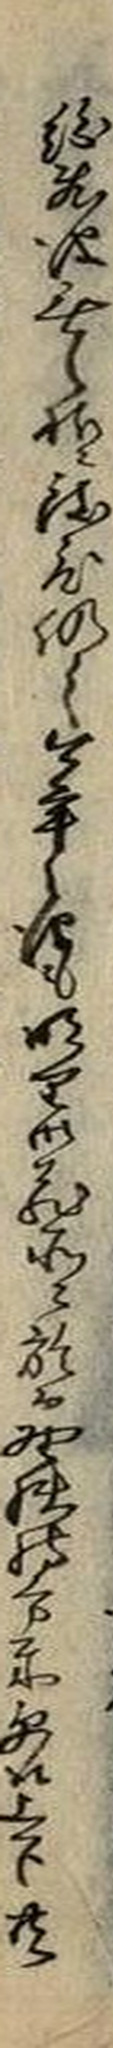紛敷儀無之様ニ致度仍之今年之儀も明里御蔵所ニ於而野扶持方米受取上下共
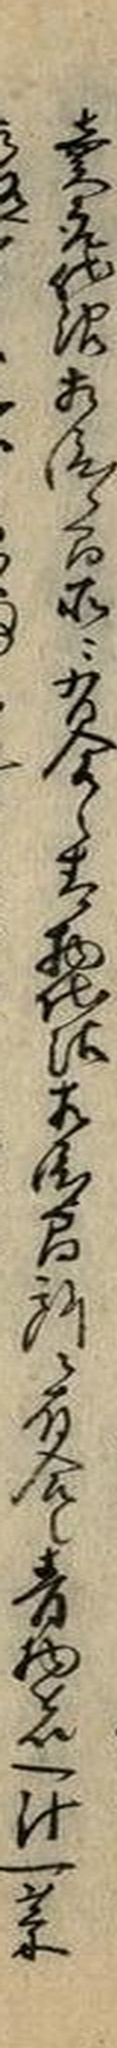売取代銀相渡候間所ニ有合之青物代銀相渡候間所ニ有合之青物を以一汁一菜
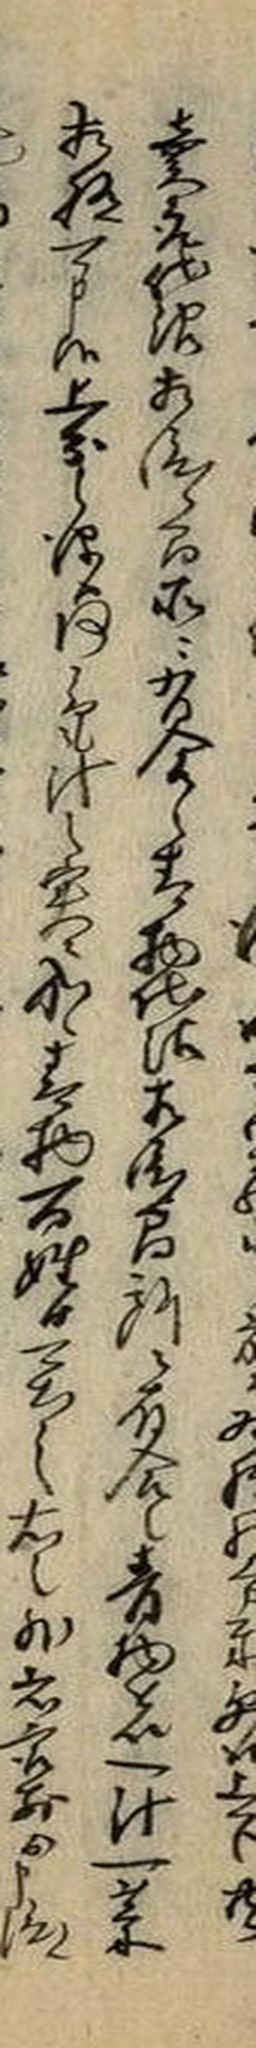相極可申候上分之儀ハ何ニ而も汁之実ニ成候青物百姓ゟ可出之右之外者最前ゟ申渡候
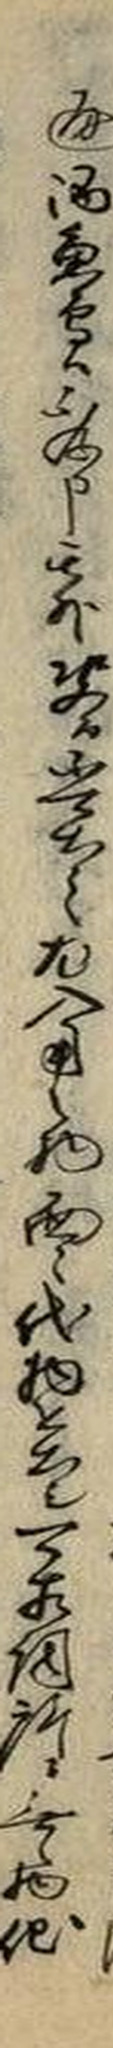通酒魚鳥ハ不及申其外決而不可出之尤入用之物面々代物を出シ可相調所ニ無之物他
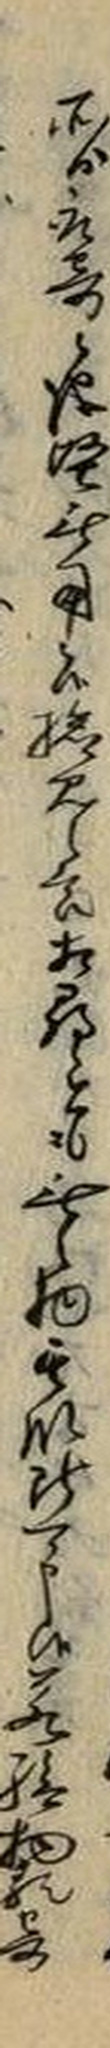所ゟ取寄候儀堅無用ニ候検見之節相尋候とも無之物其段断可申候若膳物類寄
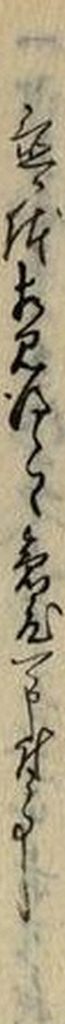置候体相見得候ハヽ急度可申付候事
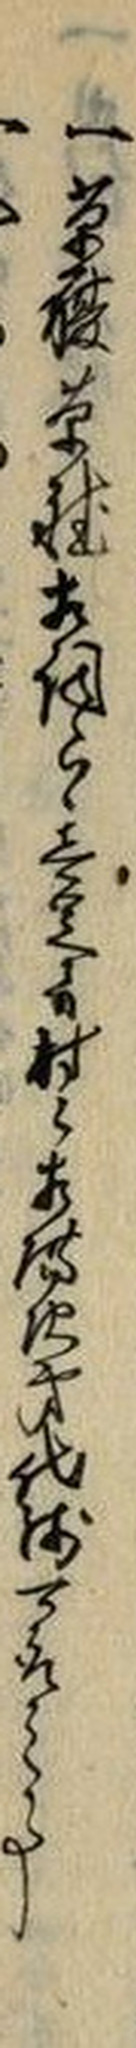一草履草鞋相調候ハヽ壱足ニ付村々相場次第代銭可取候事
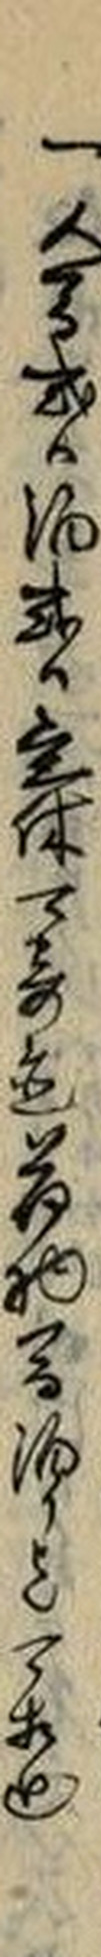一人馬或ハ泊或ハ昼休可寄置荷物馬泊り迄可相廻
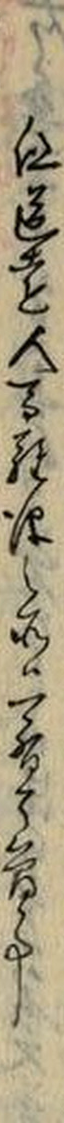但道遠人馬難儀之所ハ可有了簡事
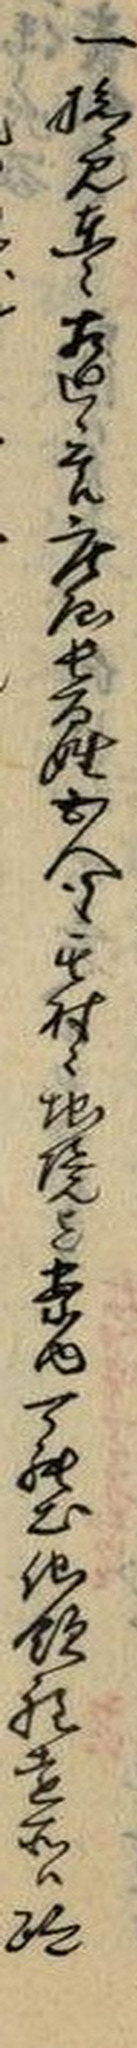一検見在々相廻候節庄屋長百姓五人ツヽ其村々地境迄案内可罷出他領程遠所ハ跡
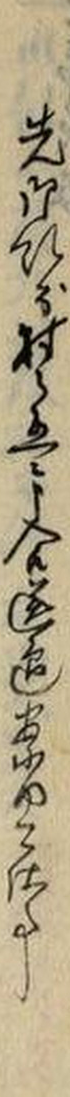先御領分村々互ニ申合送迎案内可仕事
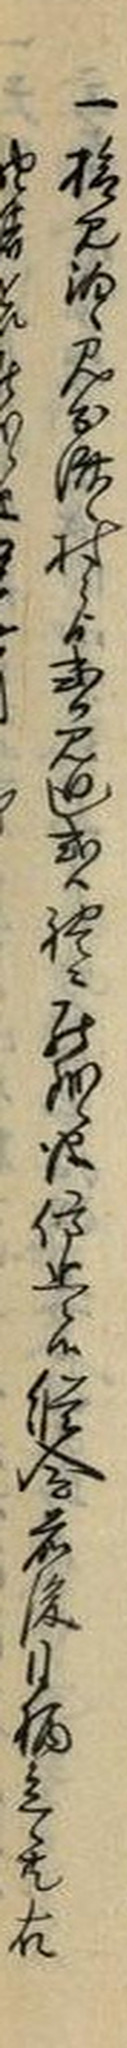一検見泊へ見分済候村々ゟ或ハ見廻或ハ礼ニ罷越候儀停止ニ候縦令前後日柄立候共右
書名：御国他国諸事之部
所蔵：福井県文書館 Fukui Prefectural Archives
